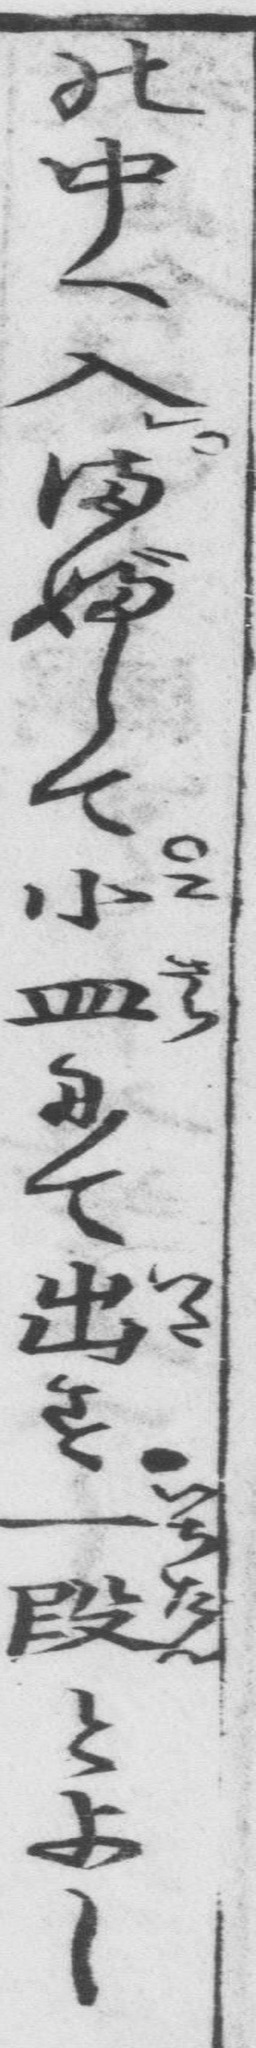の中へ入れ。まぶして。小皿にて出す。一段とよし
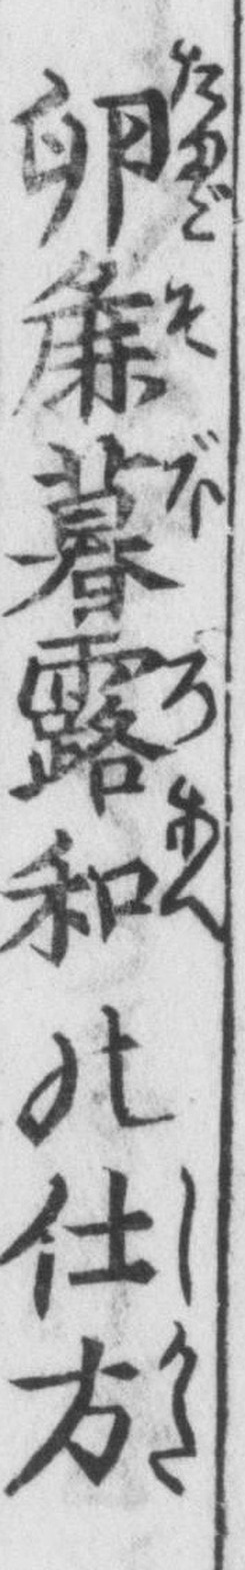卵麁暮露和の仕方
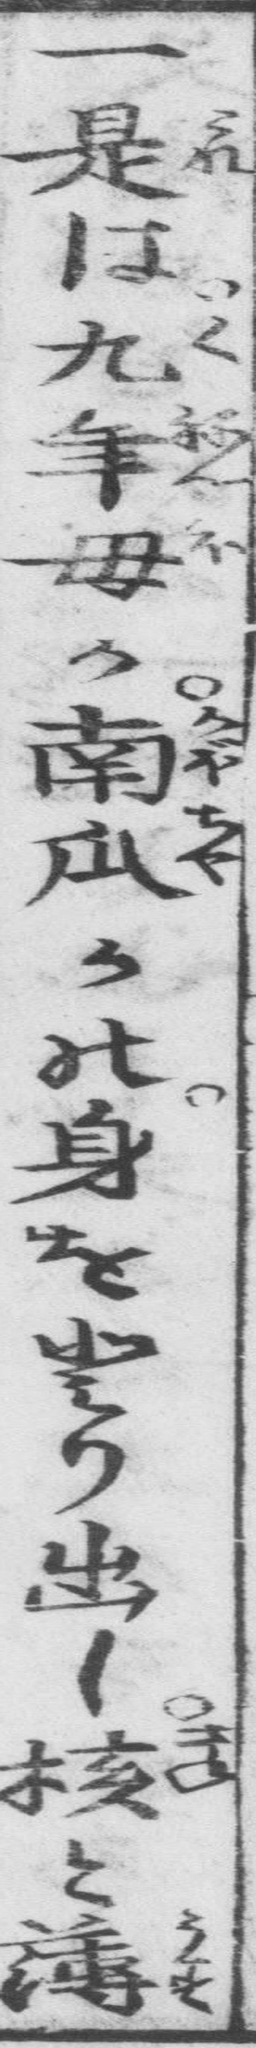一是は。九年母か。南瓜かの。身をとり出し。核と薄
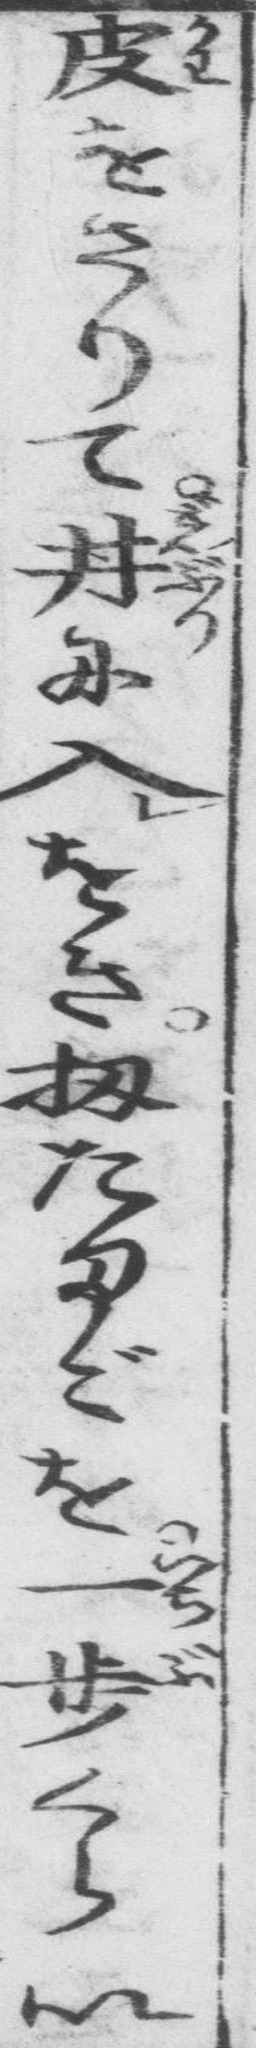皮をさりて。丼に入れをき。扨たまごを。一歩くらい
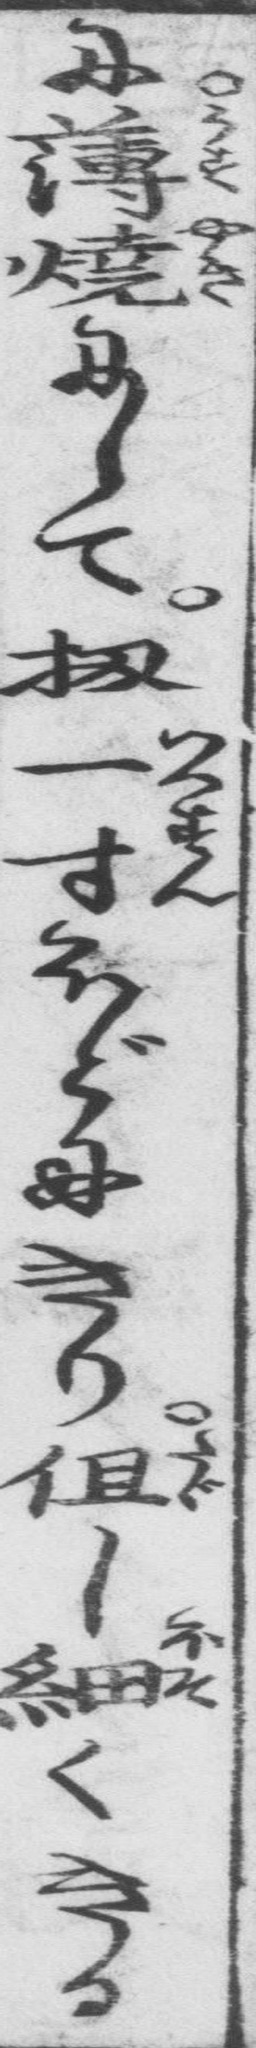に。薄焼にして。扨一寸ほどにきり。但し細くきる
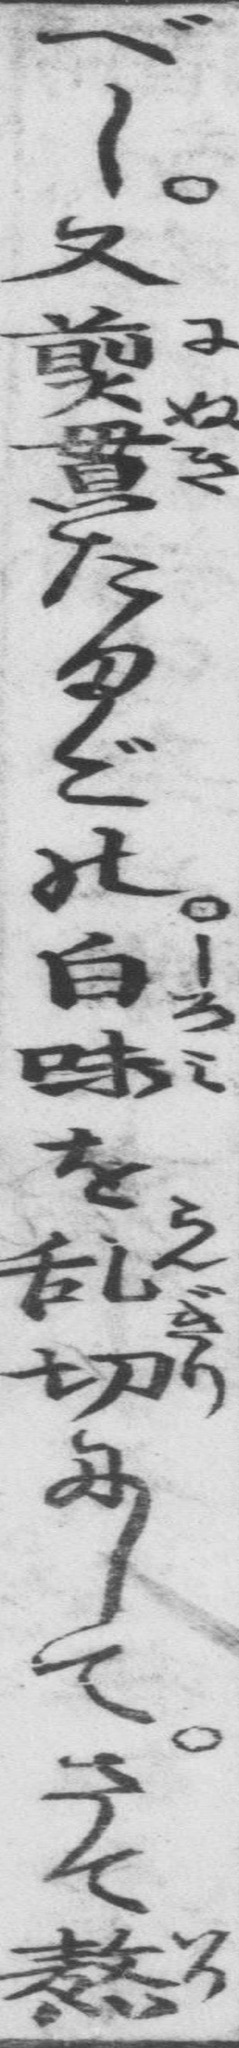べし。又煎貫たまごの。白味を乱切にして。さて熬

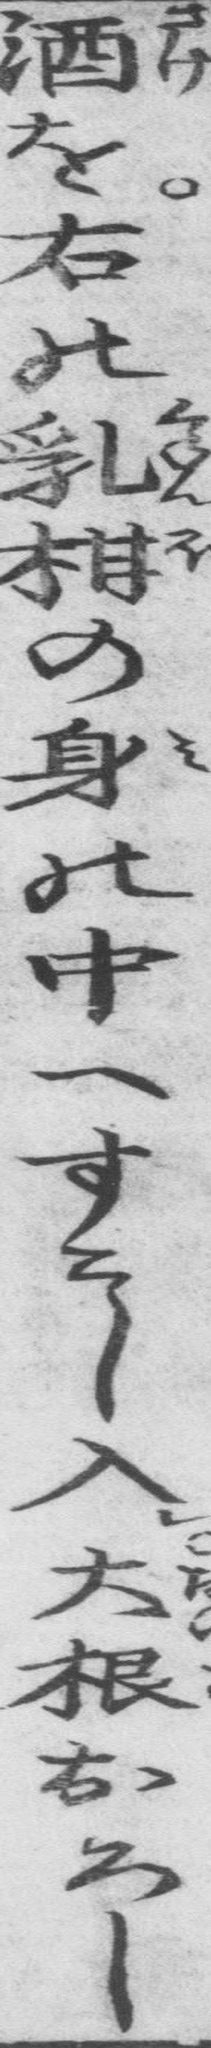酒を。右の乳柑の身の中へすこし入れ。大根おろし
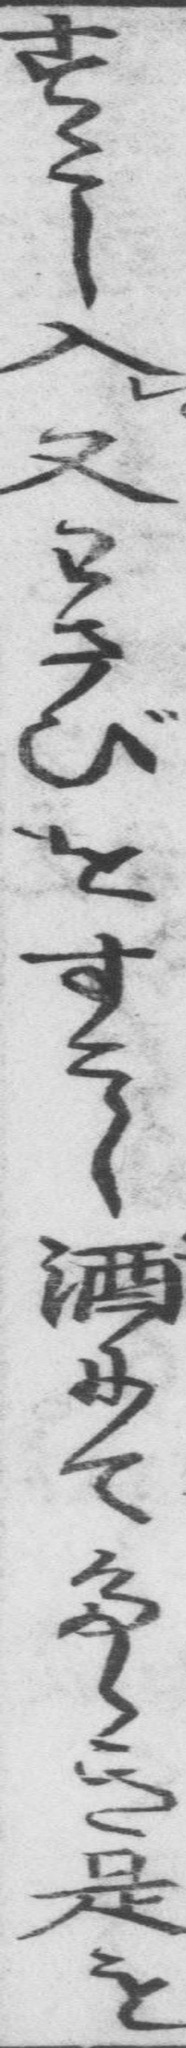すこし入れ。又わさびをすこし酒にてたゝき。是も
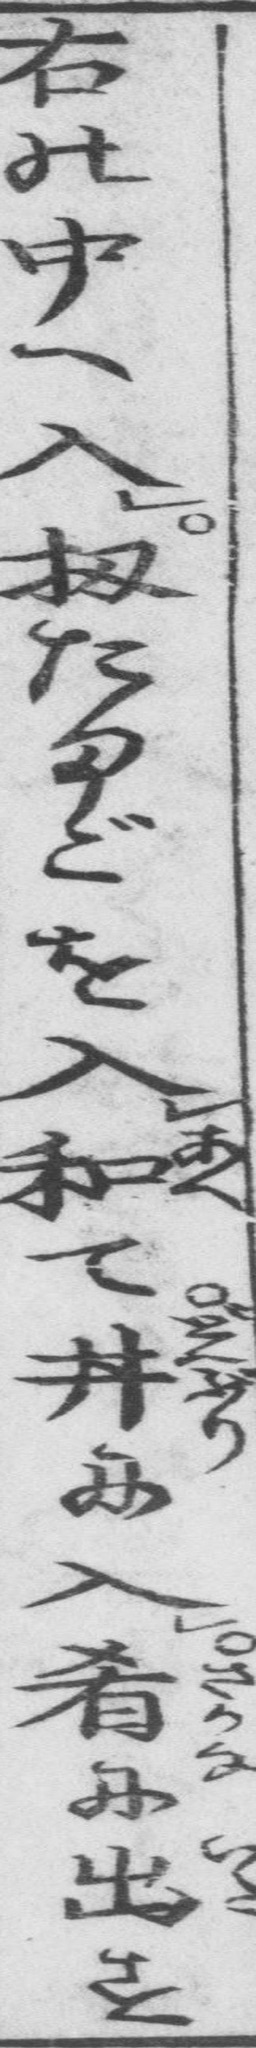右の中へ入れ。扨たまごを入れ和て。丼に入れ。肴に出す
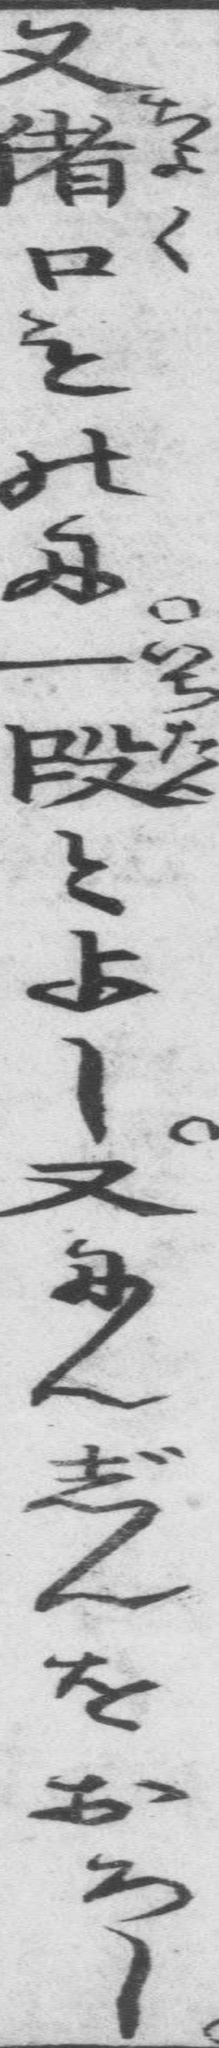又猪口ものに。一段とよし。又にんじんをおろし。
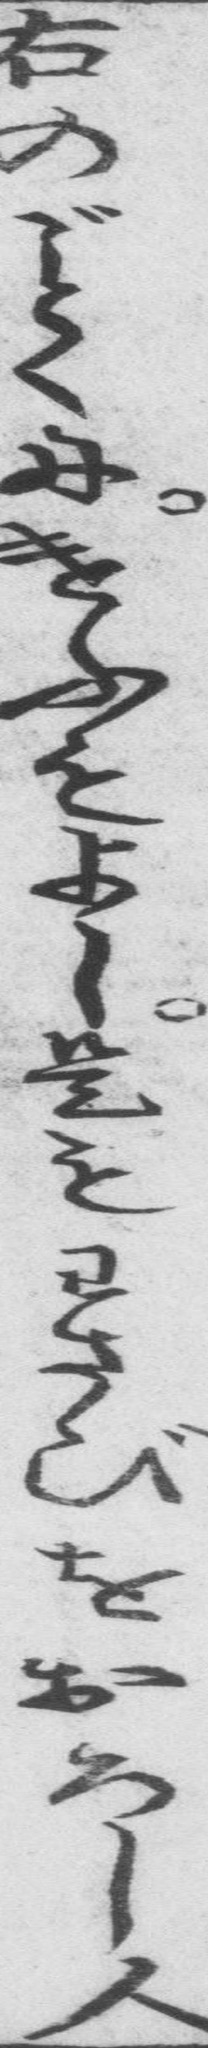右のごとくに。遣ふもよし。是もわさびをおろし。人
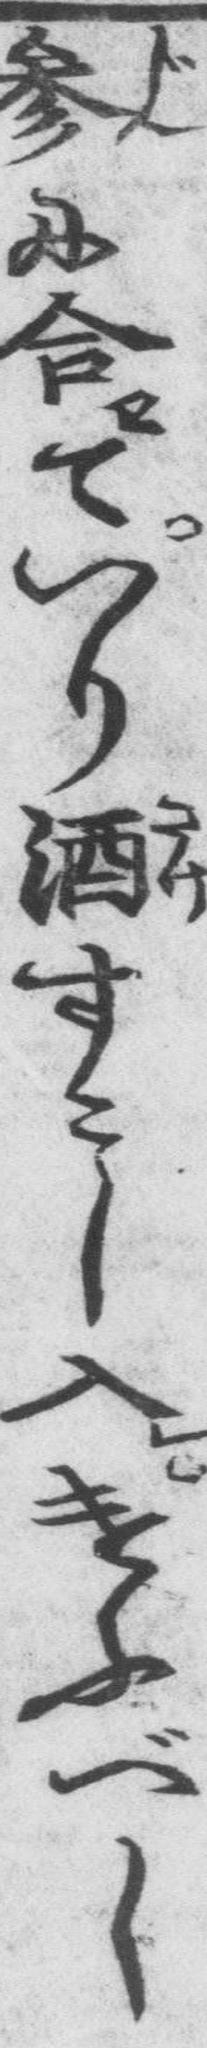参に合せて。いり酒すこし入れ。遣ふべし
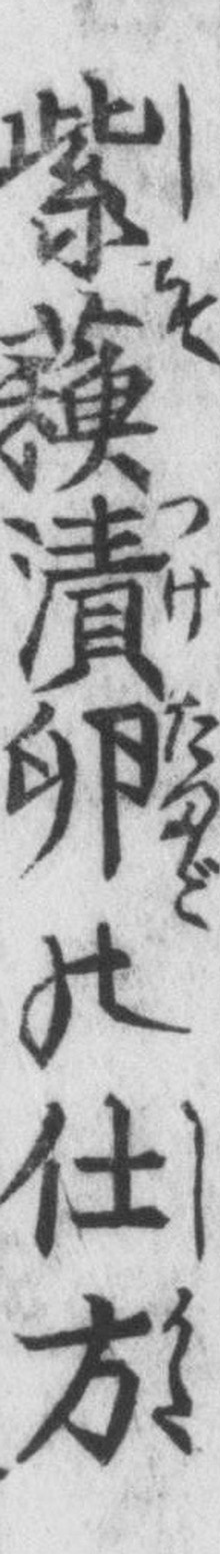紫蘇漬卵の仕方
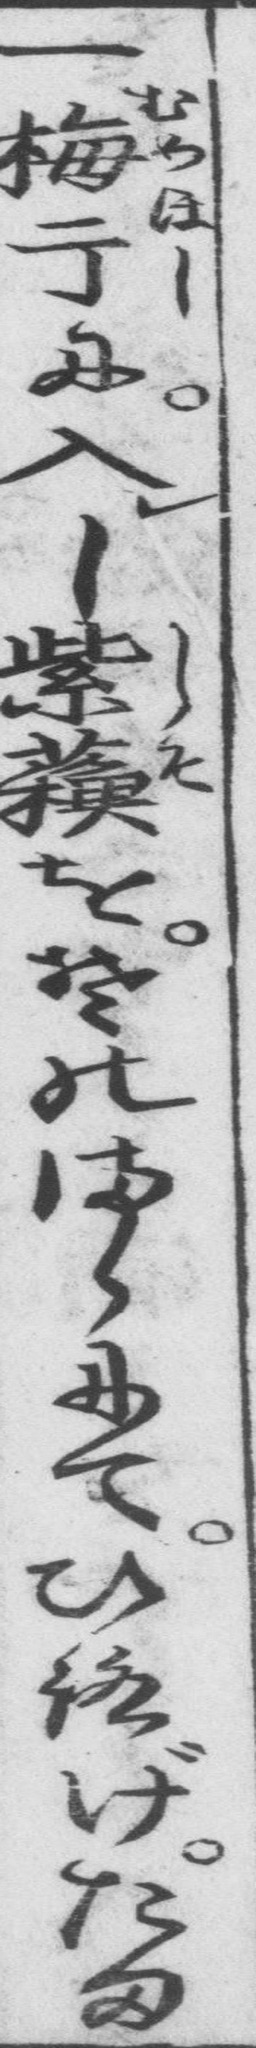一梅干に。入れし紫蘇を。そのまゝにて。ひろげ。たま
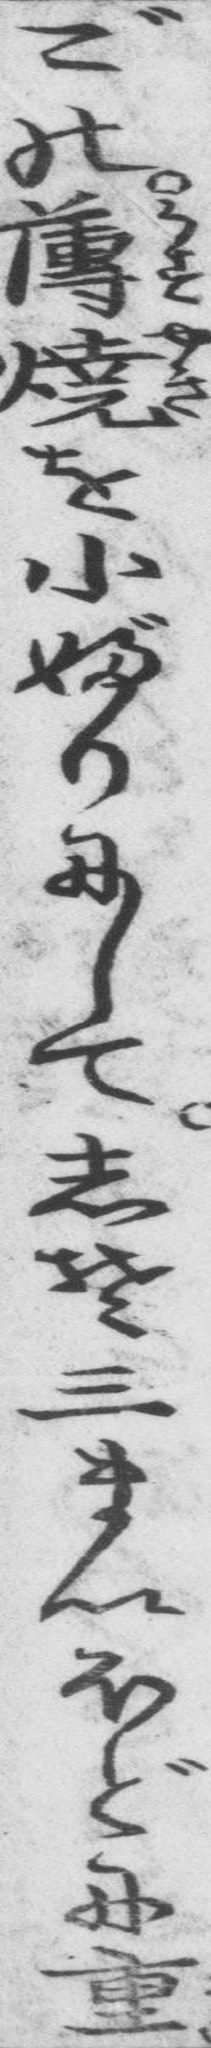ごの。薄焼を小ぶりにして。しそ三まいほどに重
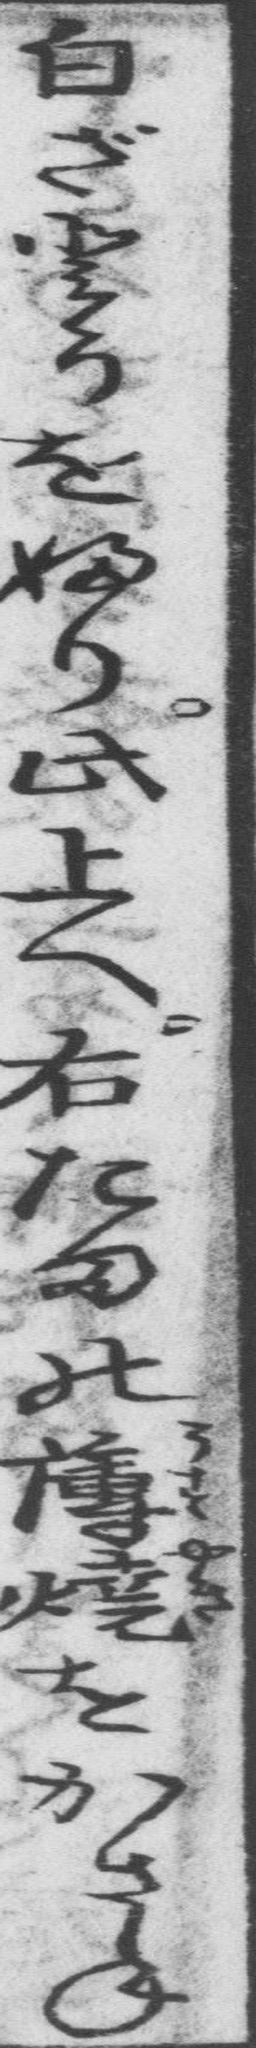白ざとうをふり。此上へ。右たまの薄焼をかさね
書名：萬寳料理秘密箱
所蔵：大阪府立大学学術情報センター 国文学研究資料館
